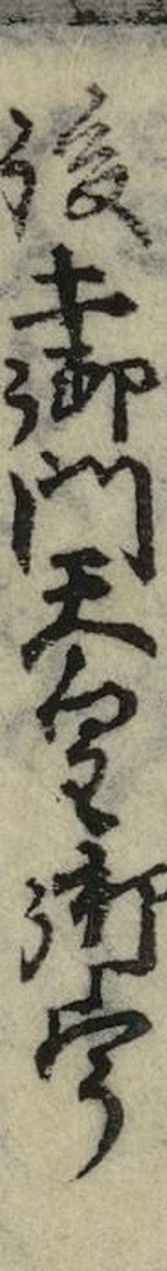後土御門天皇御宇
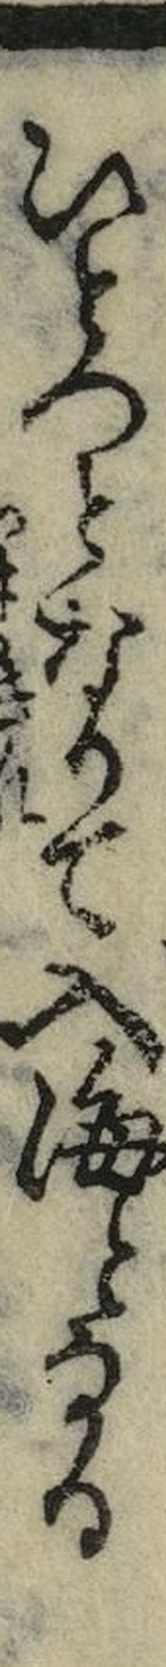ひとつとなりて入海となる
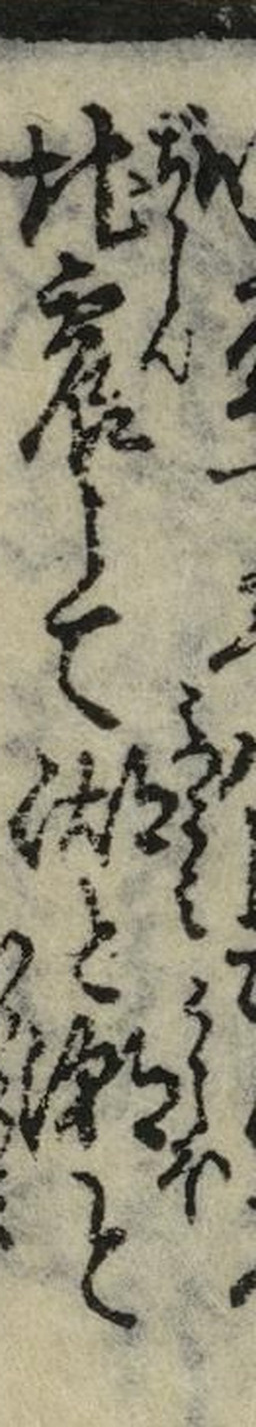地震して湖と潮と
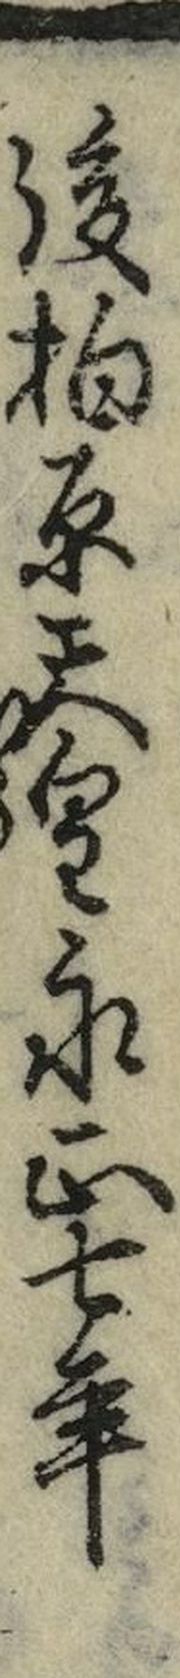後柏原天皇永正七年
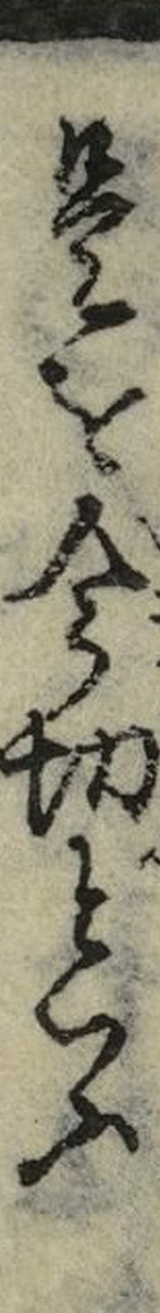是を今切といふ
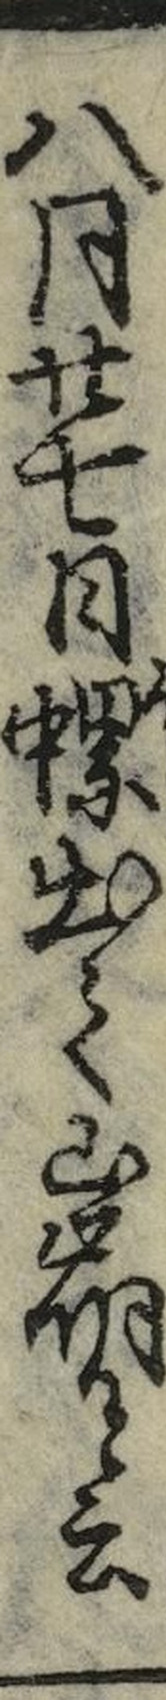八月廿七日螺出て山崩と云
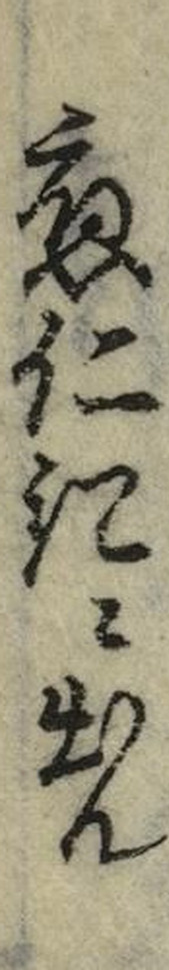応仁紀に出る

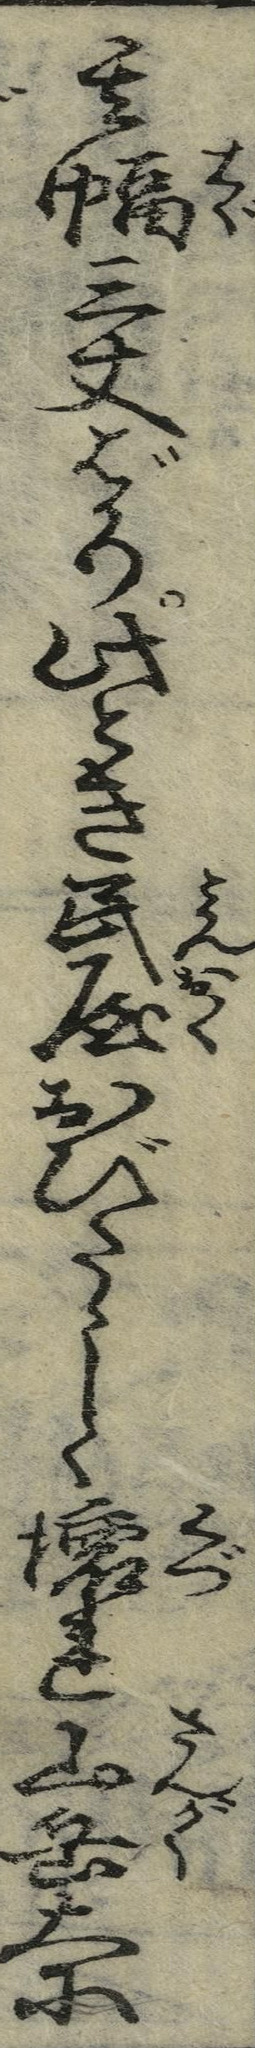其幅三丈ばかり。此とき民屋おびたゝしく壊れ山岳大に
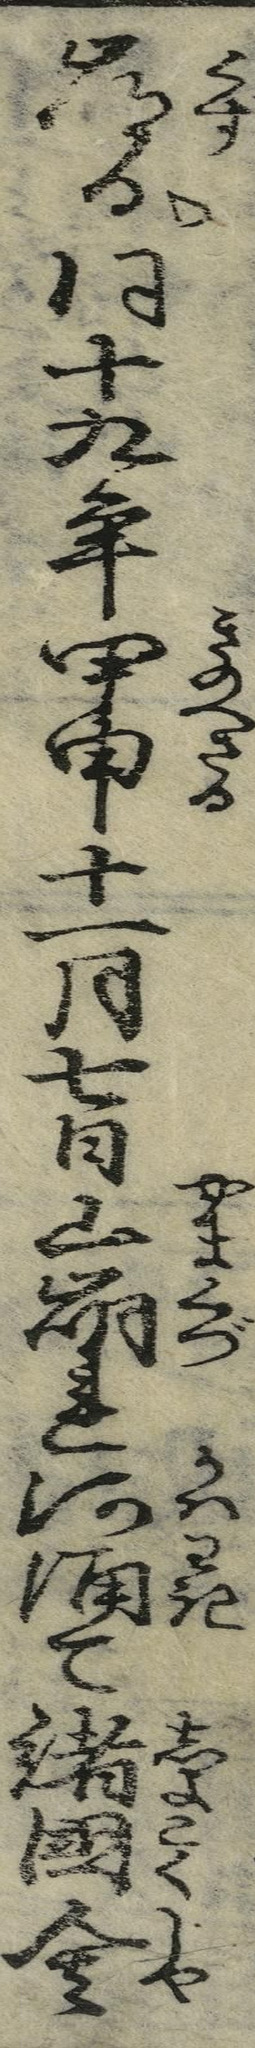崩る。同十九年甲申十一月七日山崩れ河涌て諸国舎
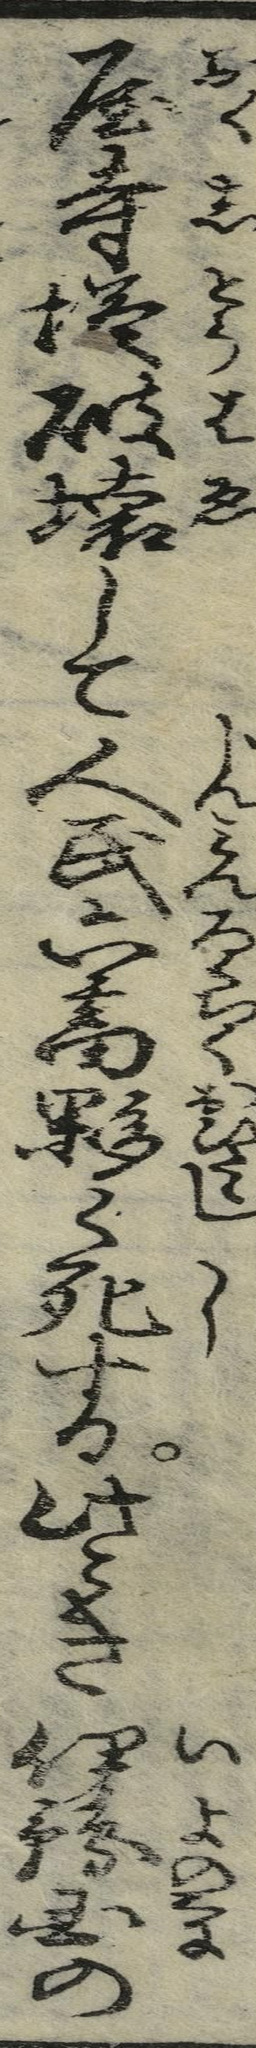屋寺塔破壊して人民六畜夥く死する。此とき伊予国の
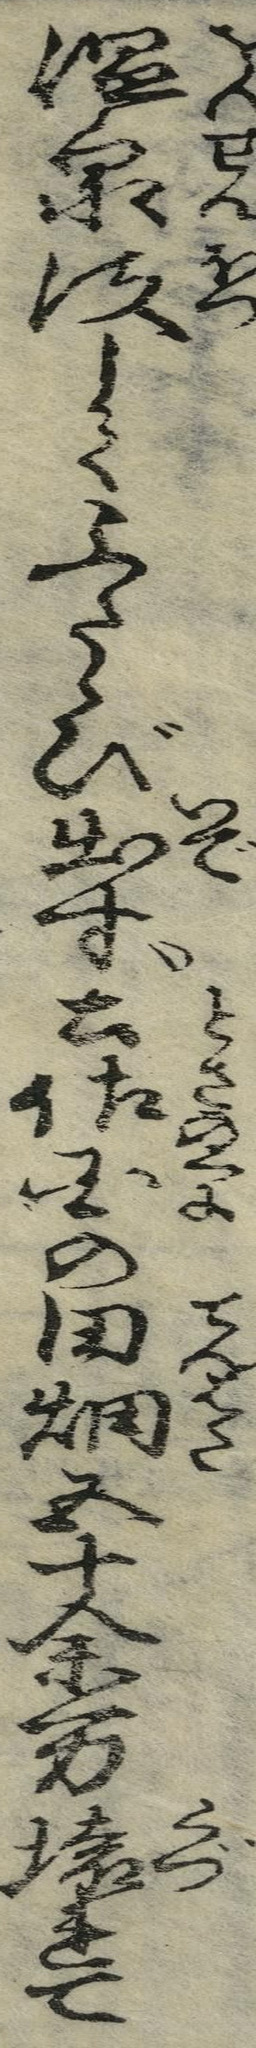温泉没してふたゝび出す。土佐国の田畑五十余万壊れて
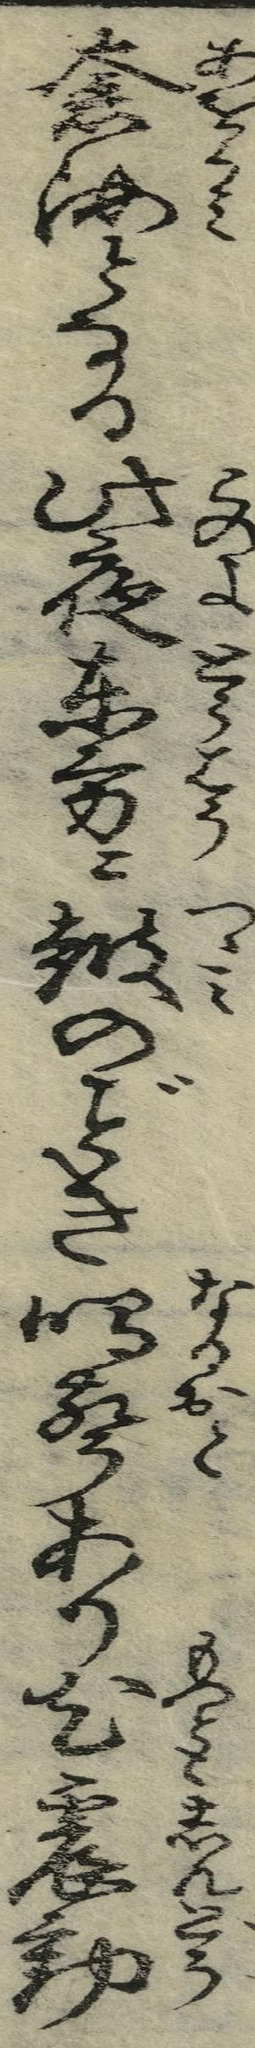蒼海となる此夜東方に鼓のごとき鳴声あり尤震動
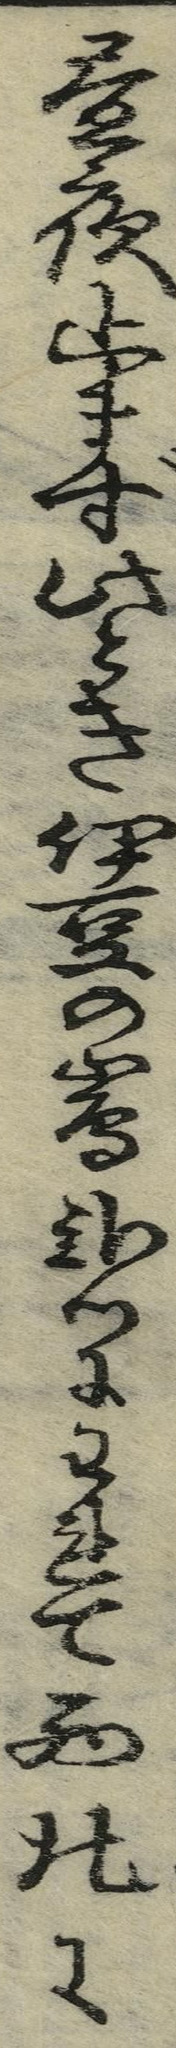昼夜止まず此とき伊豆の嶋弐つにわれて西北に
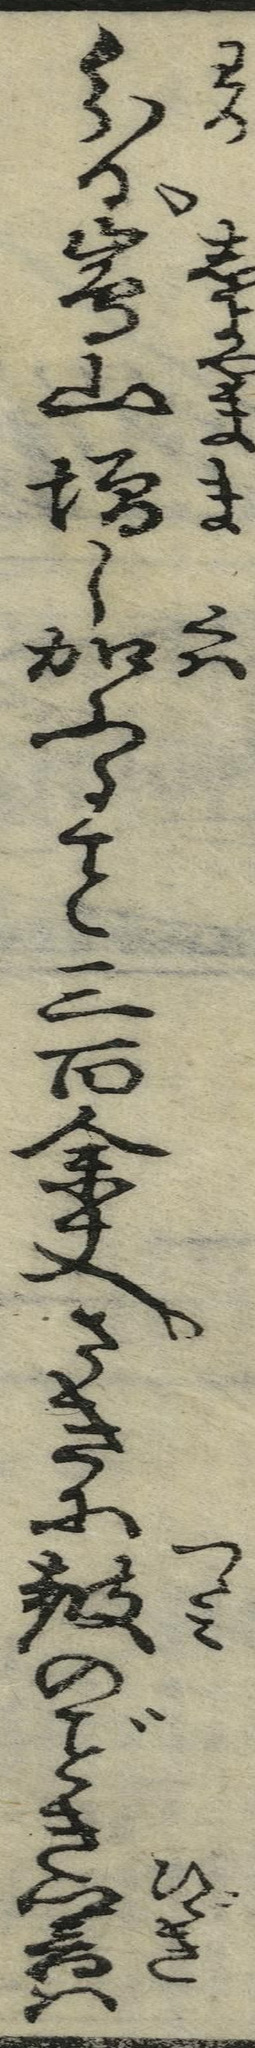分る。嶋山増し加ふること三百余丈。さきに鼓のごとき響は
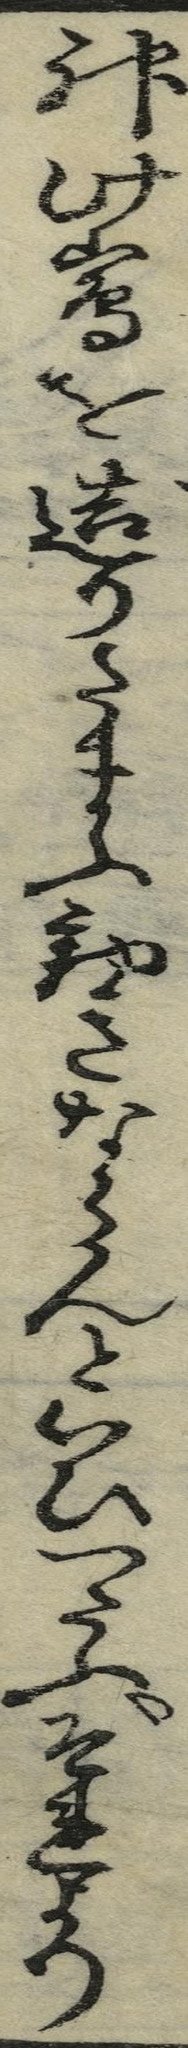神此嶋を造りたまふ動きならんといひつたふ。それより
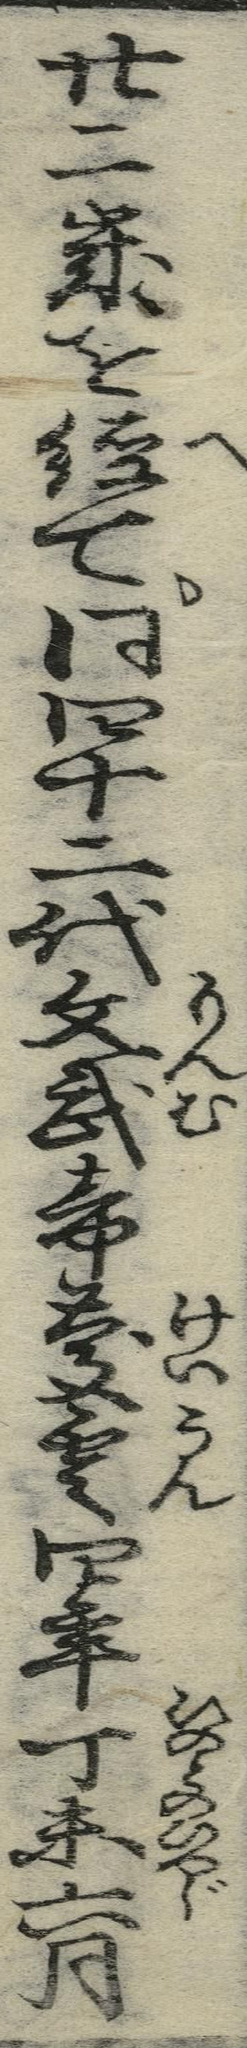廿二歳を経て。同四十二代文武帝慶雲四年丁未六月
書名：本朝地震記　全
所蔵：東京大学地震研究所図書室 Earthquake Research Institute Library, The University of Tokyo, JAPAN
